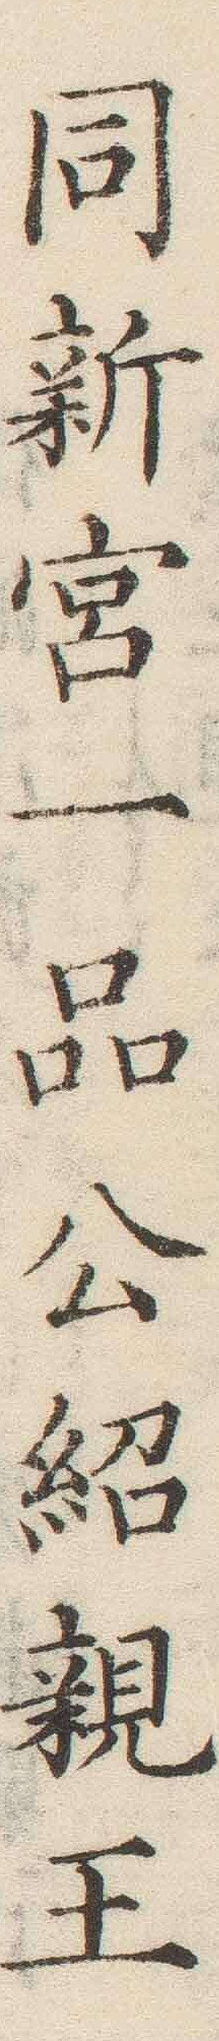同新宮一品公紹親王
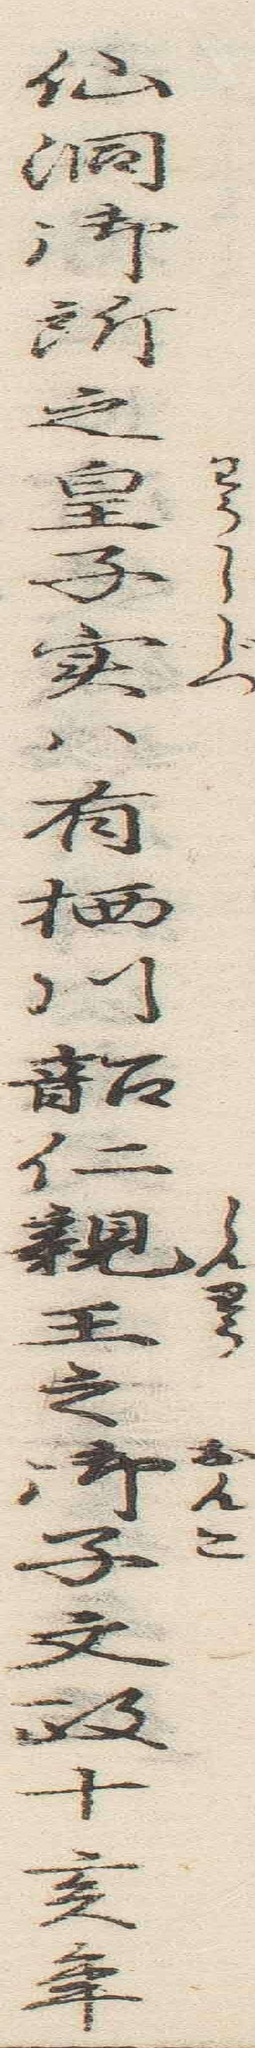仙洞御所之皇子実は有栖川韶仁親王之御子文政十亥年
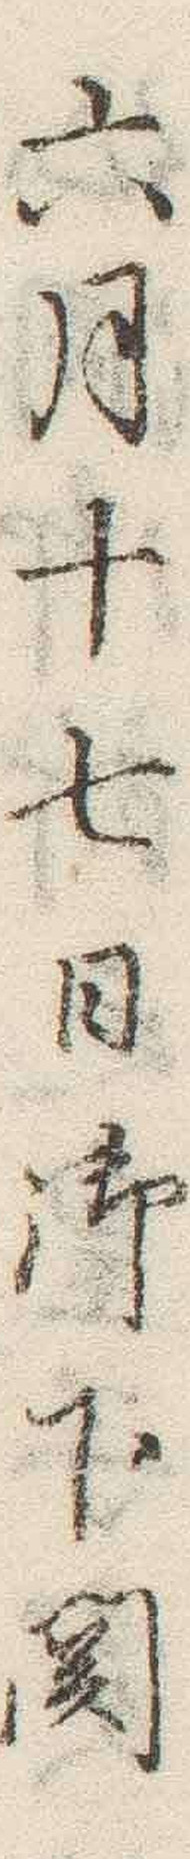六月十七日御下関
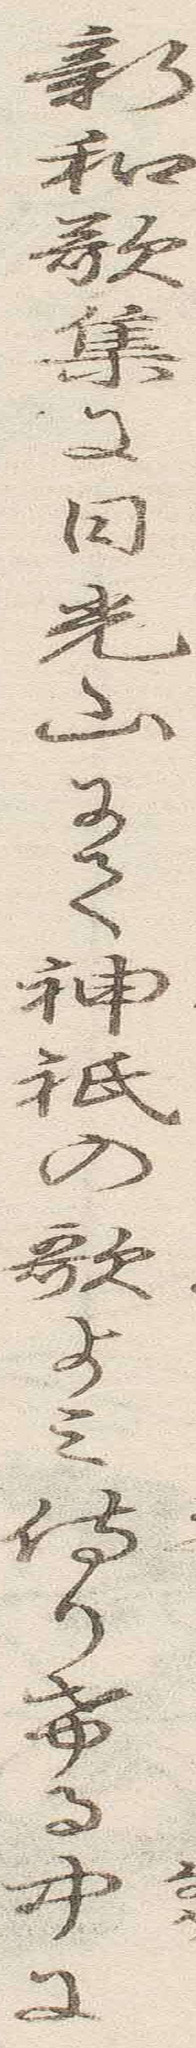新和歌集に日光山にて神祇の歌よみ侍りける中に
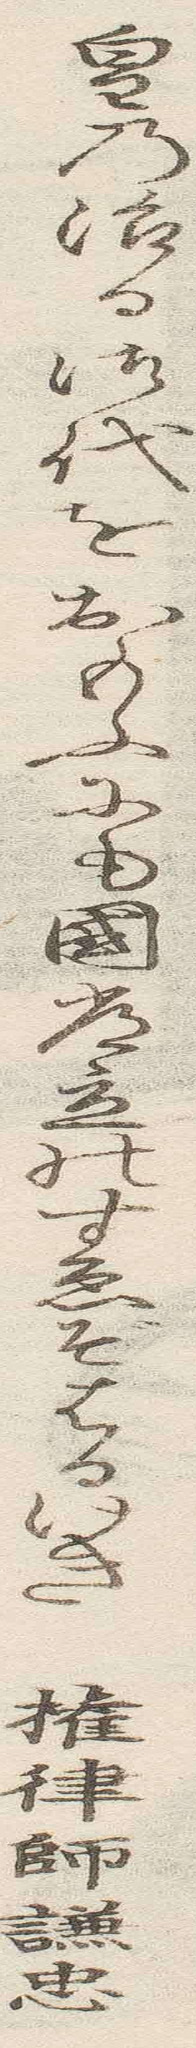皇の治る御代をおもふにも國常立のすゑぞはるけき権律師譙忠
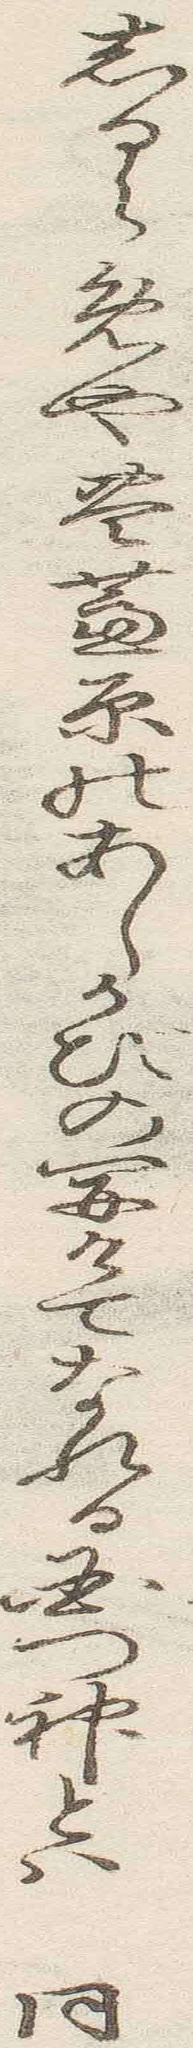しるらめや豊葦原のあしかひの開けてなれる国つ神とは同
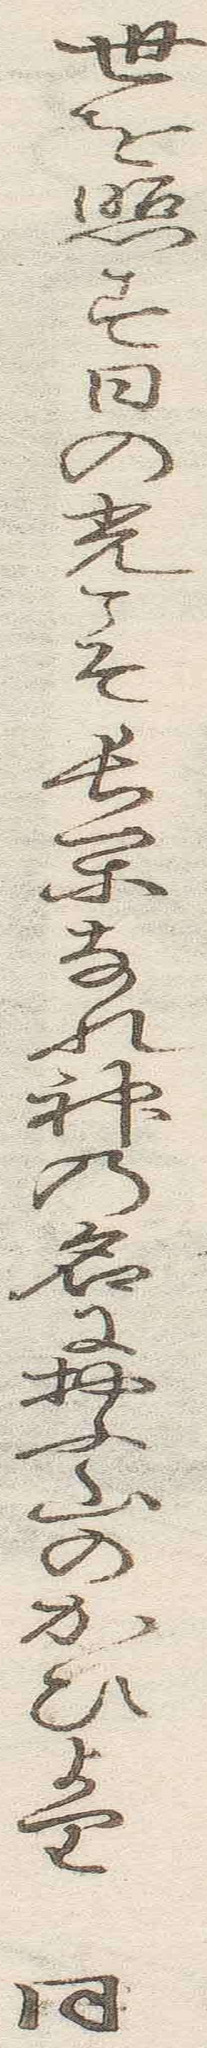世を照す日の光こそ長閑なれ神の名におふ山のかひより同
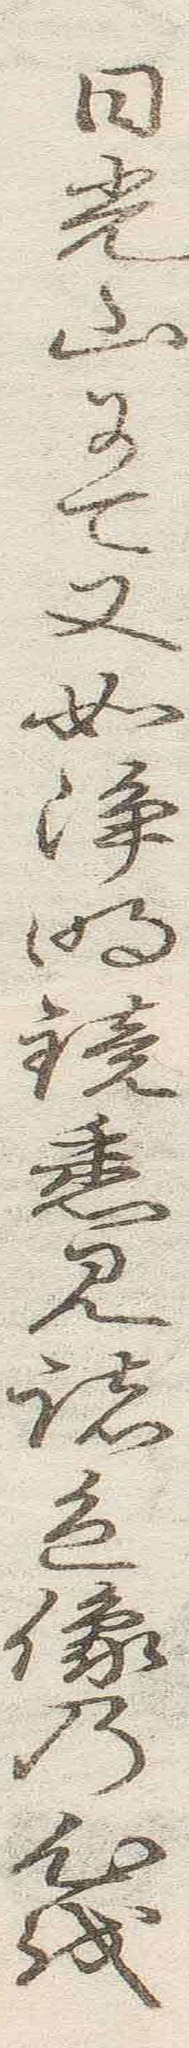日光山にて又如浄明鏡悉見諸色像の心を
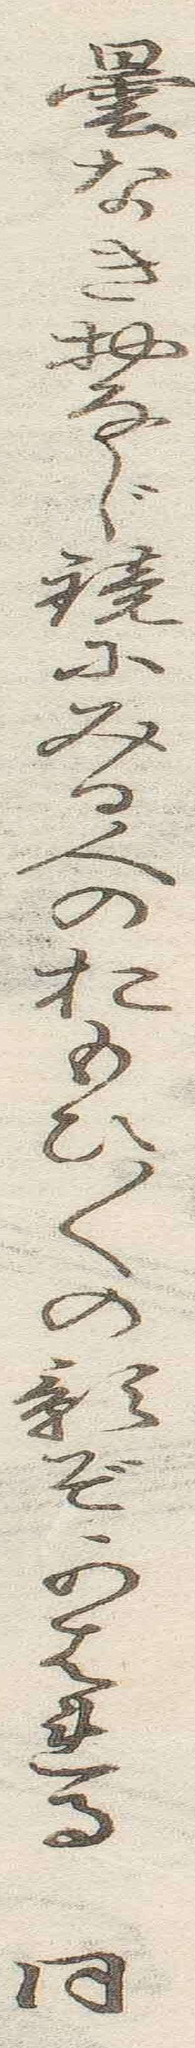曇なきおなじ鏡にみる人のおもひ〳〵の影ぞかはける同
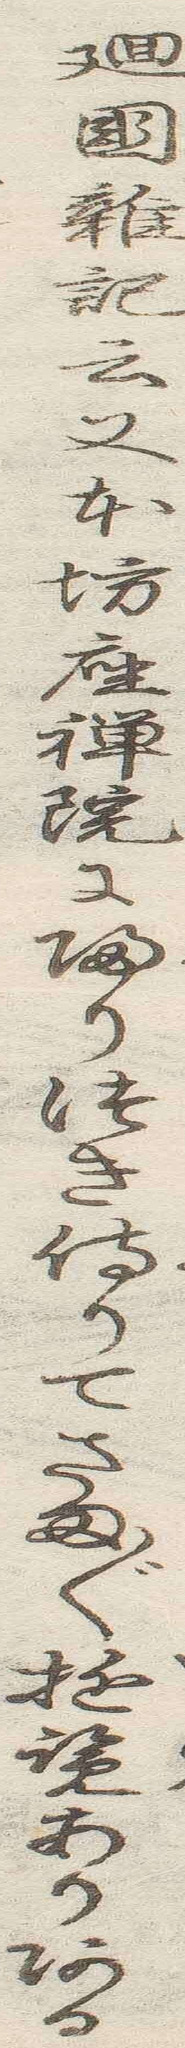廽国雜記云又本坊座禅院に帰りつき侍りてさま〴〵逰覧ありある
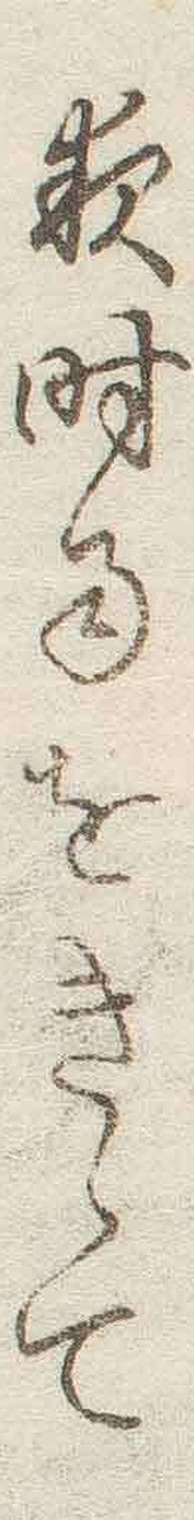夜时雨をきゝて
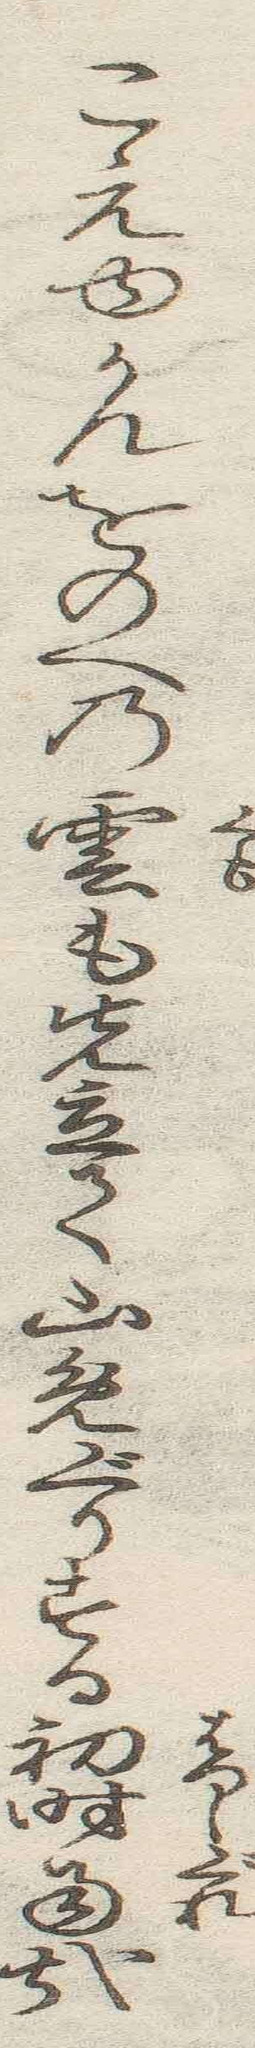こえゆかんをのへの雲も先立て山めぐりする初时雨哉
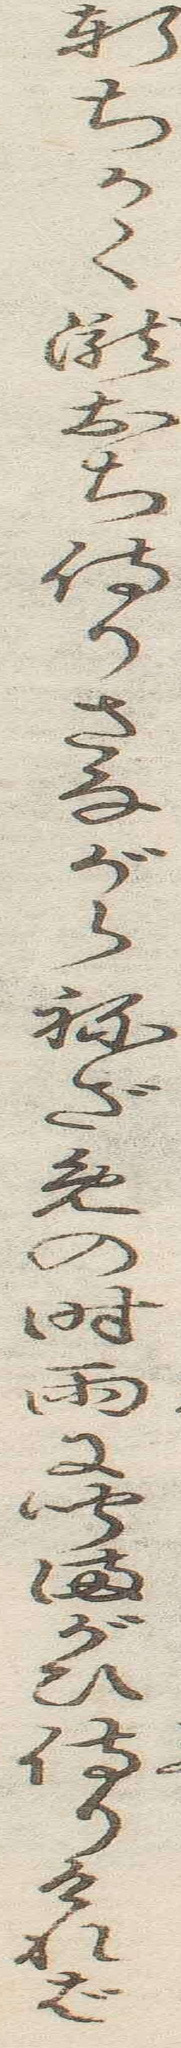軒ちかく瀧おち侍りさながらねざめの时雨に聞まがひ侍りければ
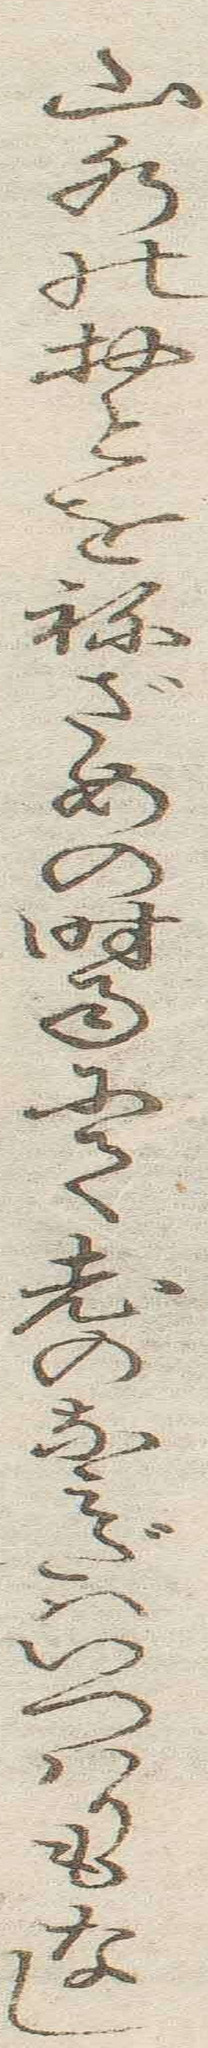山水のおとをねざめの时雨にて老のなみだはいつはりもなし
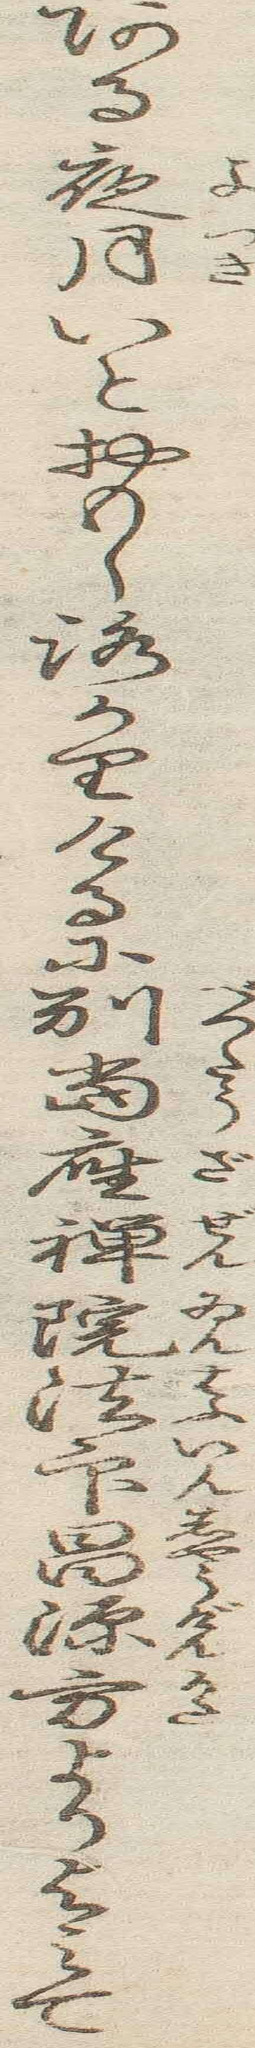ある夜月いとおもしろかりけるに別當座禅院法印昌源方よりよみて

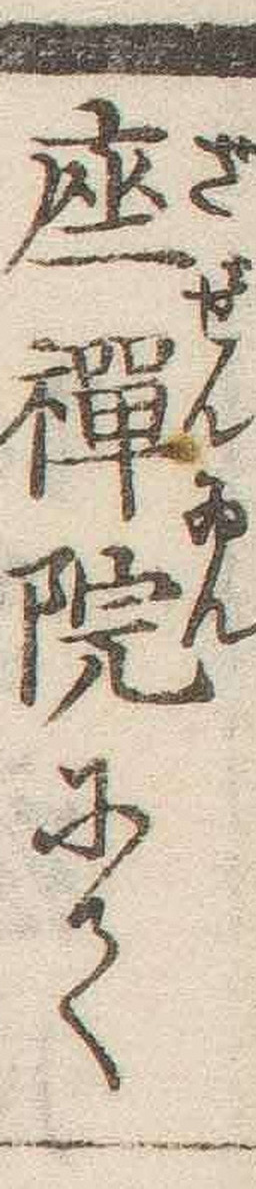座禪院にて
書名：日光山志
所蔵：東京学芸大学附属図書館 国文学研究資料館
